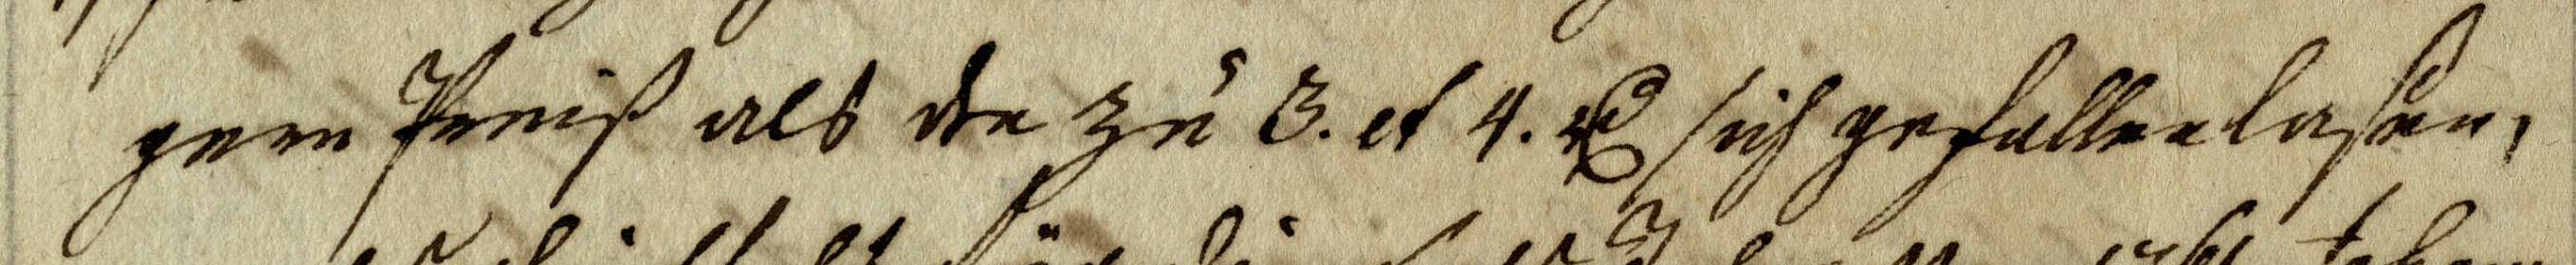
gern Preiß als den zu 3. et 4. r sich gefallen laßen,
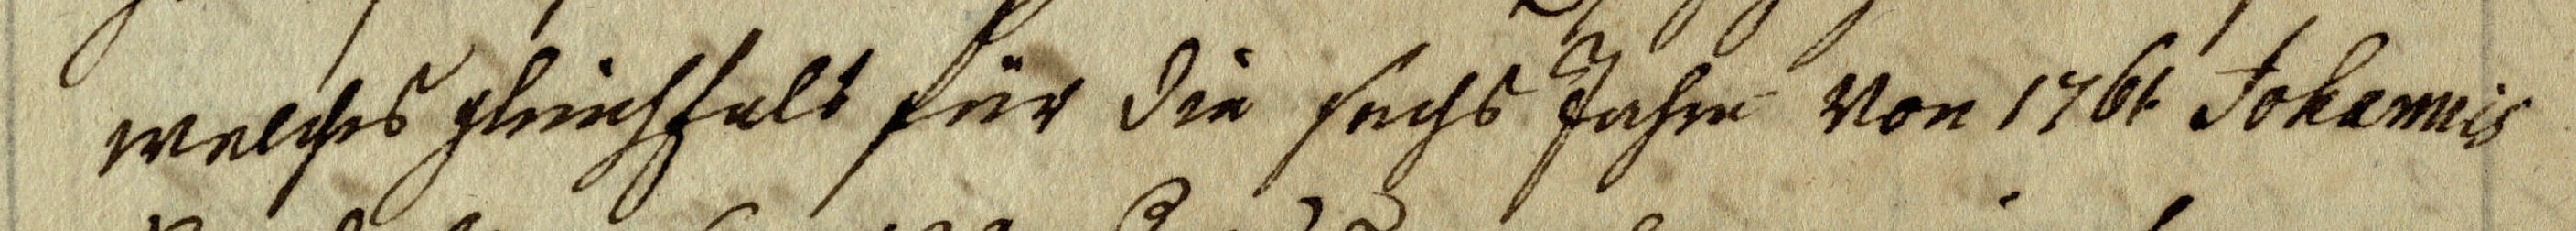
welches gleichfals für die sechs Jahre von 1761. Johannis
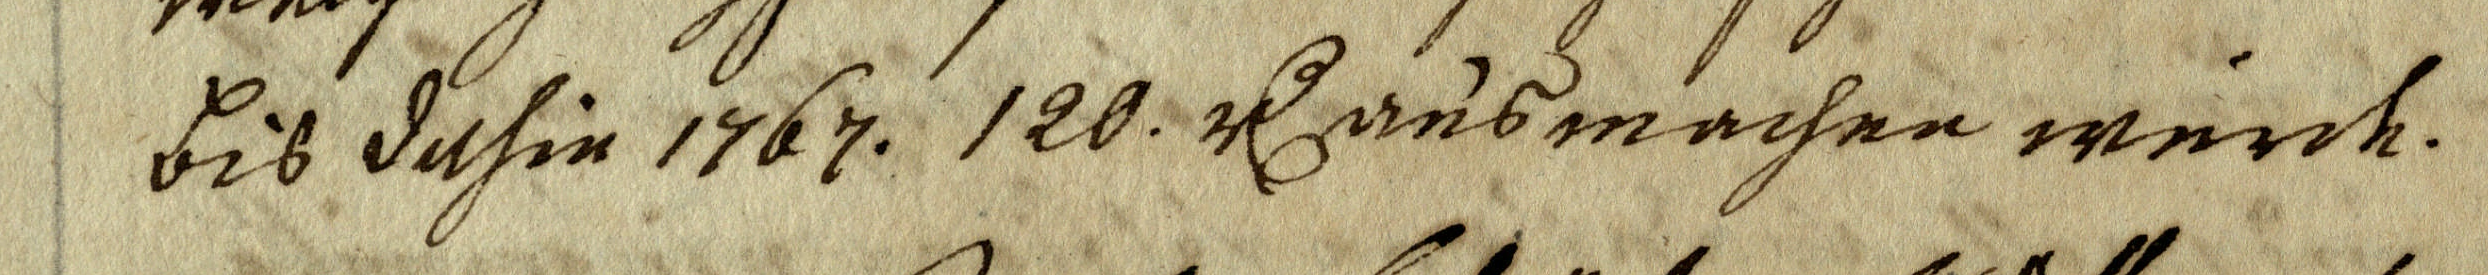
bis dahin 1767. 120. rt ausmachen würde.
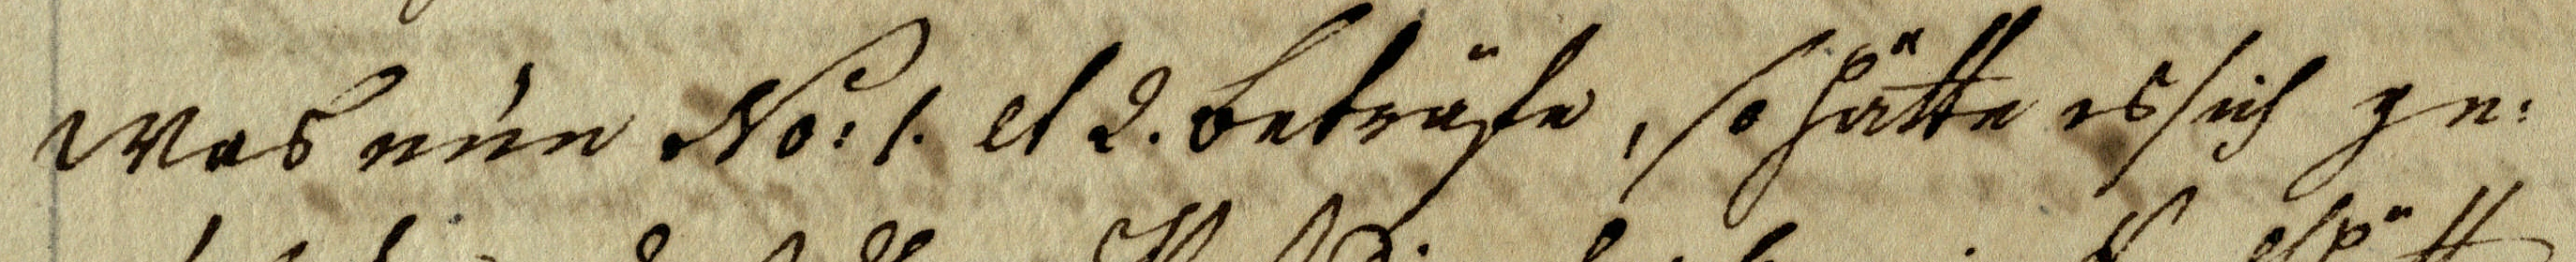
was nun No. 1. und 2. beträfe, so hätte es sich ge¬
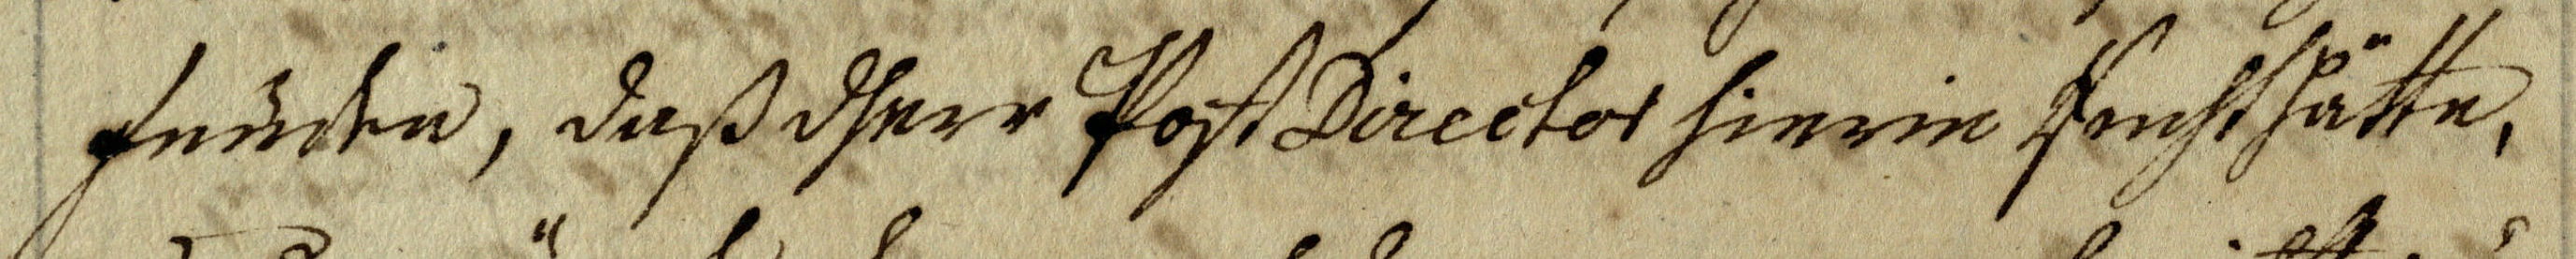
funden, daß dHerr PostDirector hierin Recht hätte,
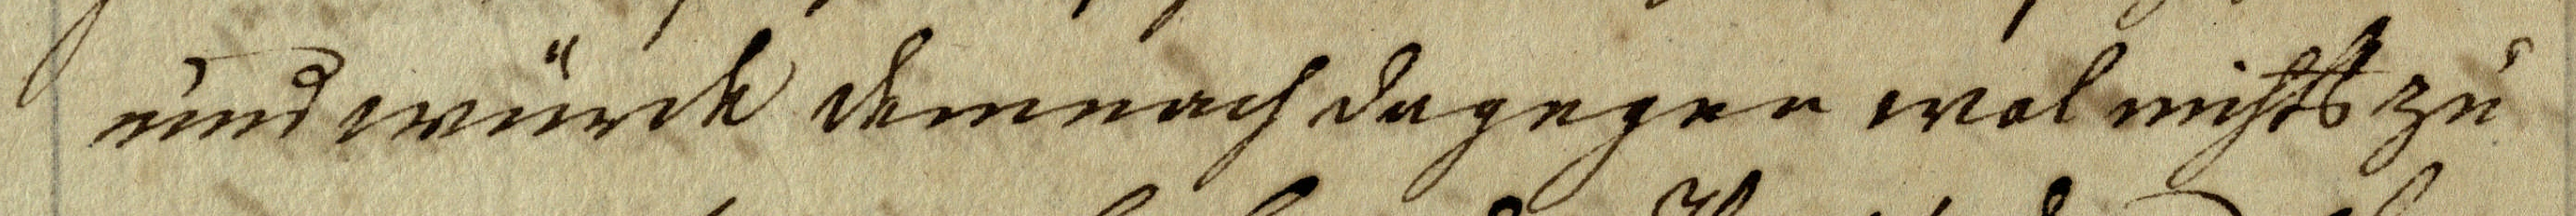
und würde dennoch dagegen wol nichts zu
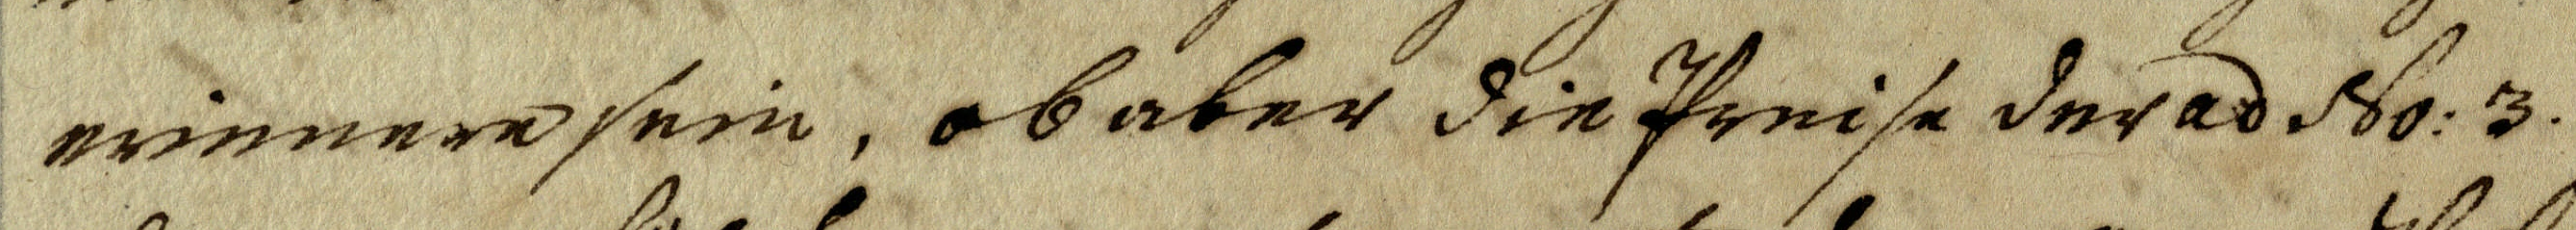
erinnern sein, ob aber die Preise der ad No. 3.
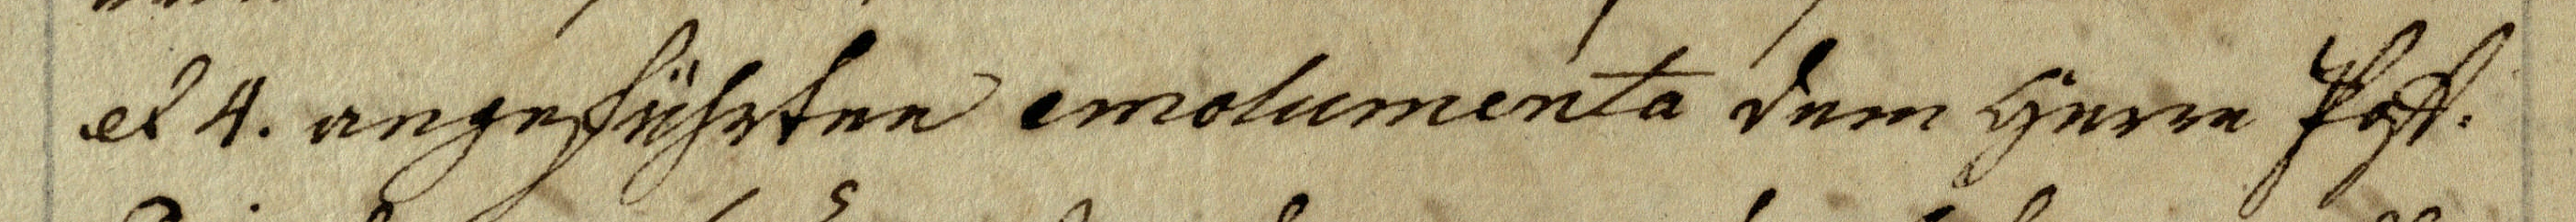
et 4. angeführten emolumenta dem Herrn Post
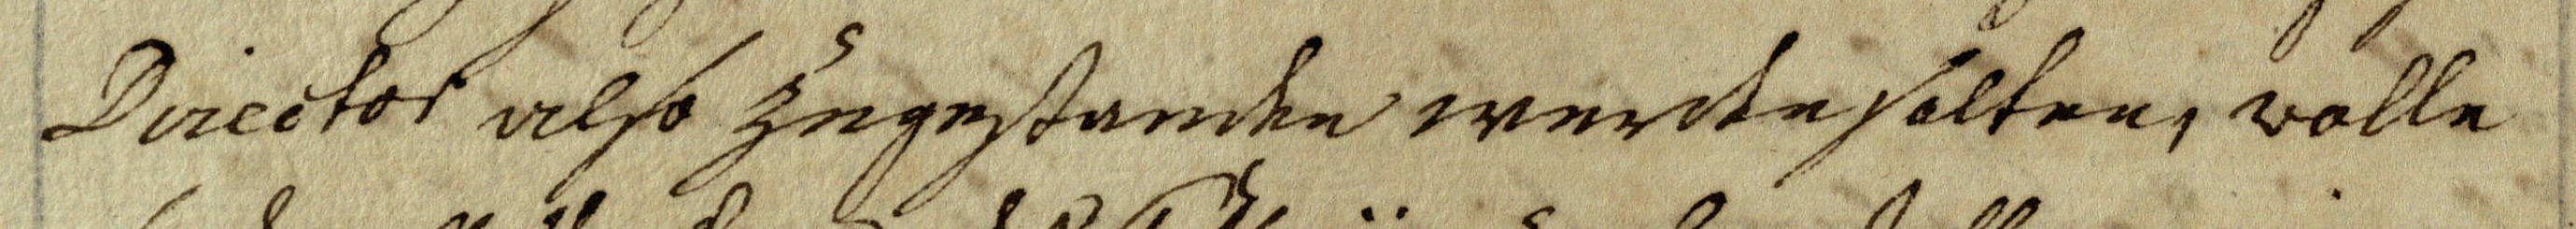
Director also zugestanden werden solten, wolle
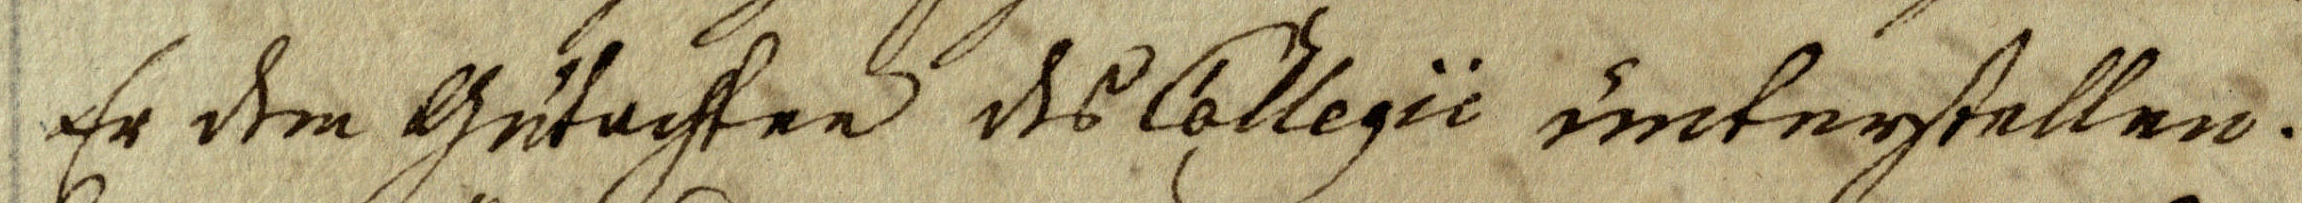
Er dem Gutachten des Collegii unterstellen.
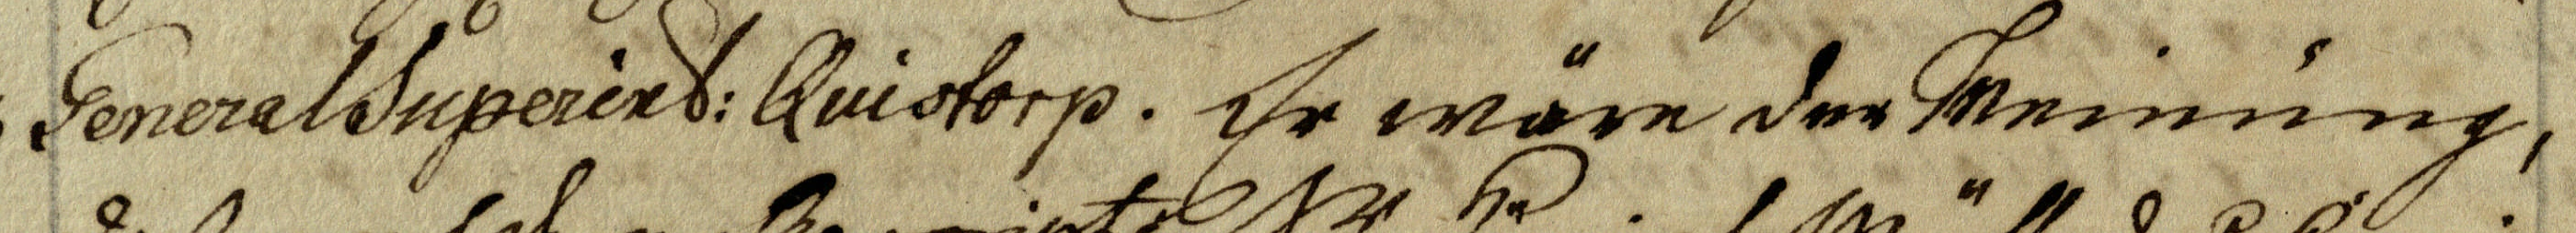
dh GeneralSuperint Quistorp. Er wäre der Meinung,
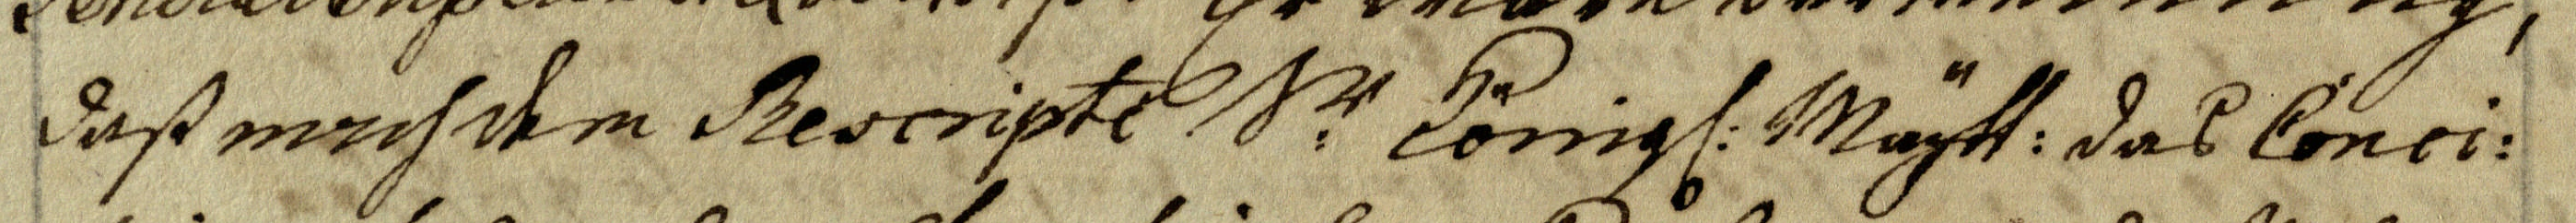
daß nach dem Rescript Sr. Königl. Maÿtt. das Conci¬
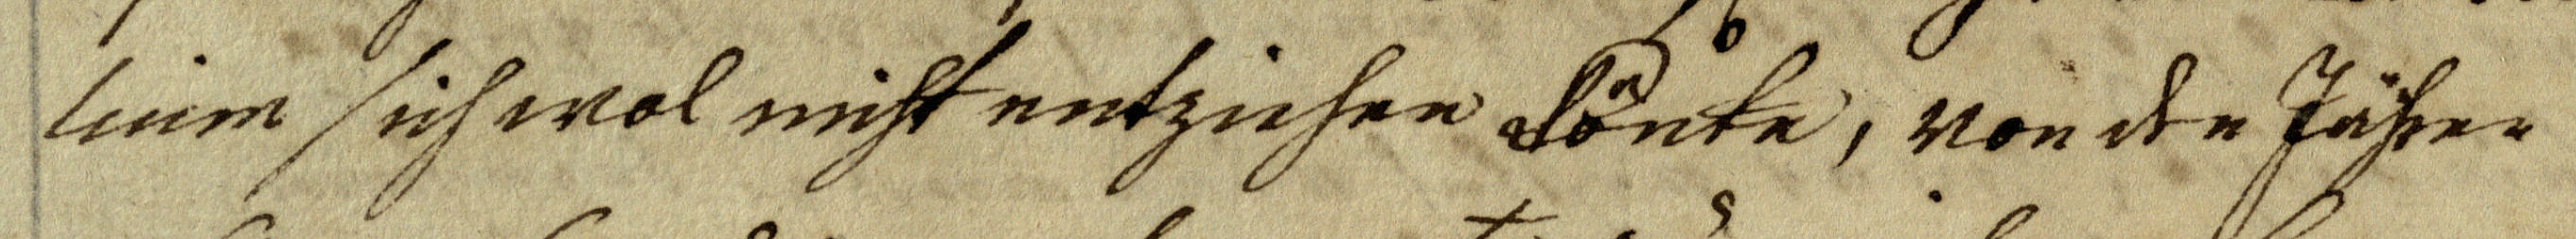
lium sich wol nicht entziehen könte, von den Jahren
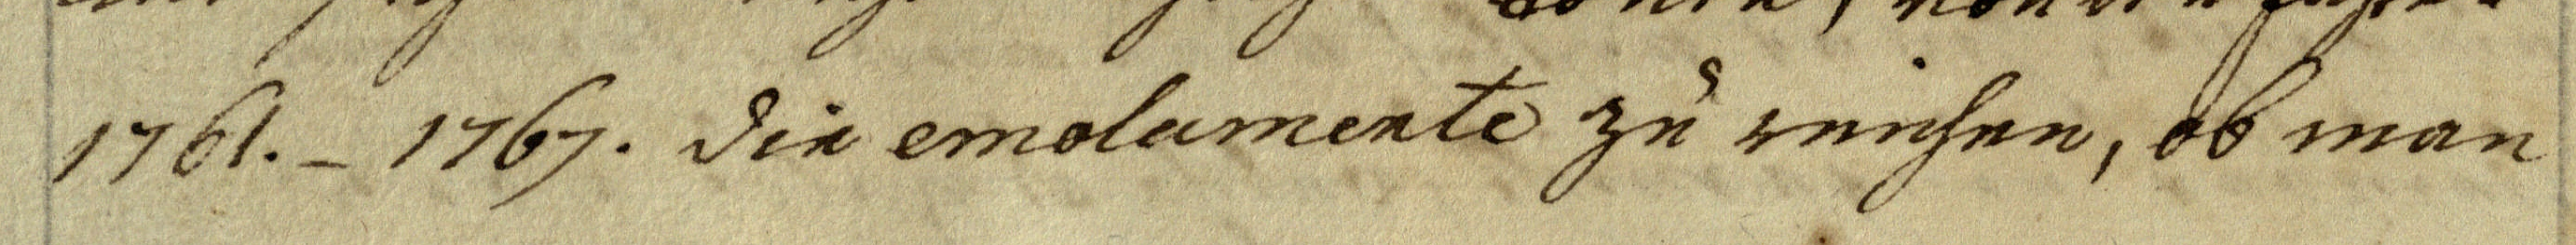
1761.-1767. die emolumente zu reichen, ob man
